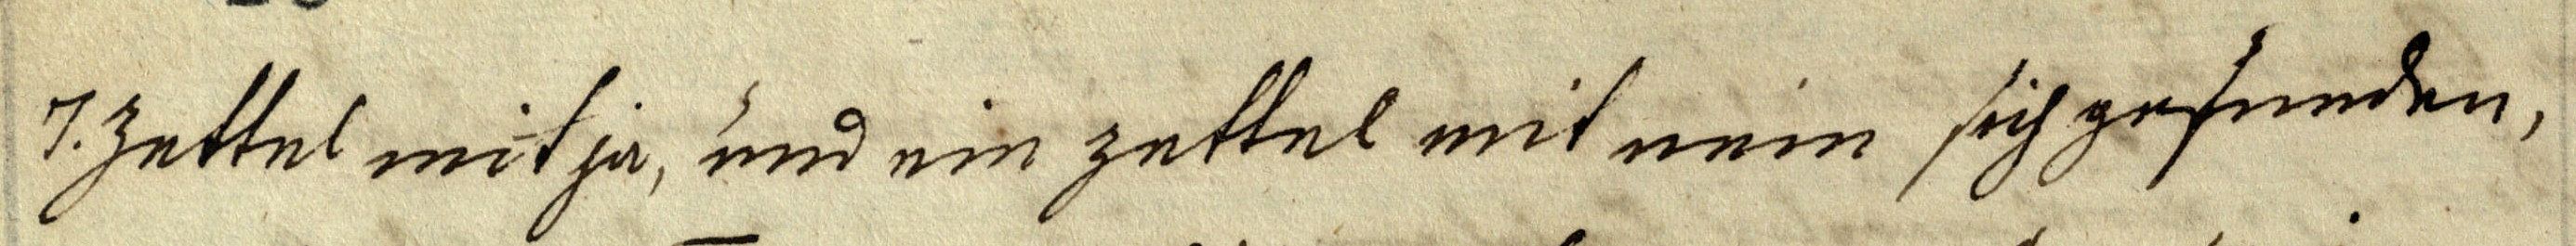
7. Zettel mit ja, und ein Zettel mit nein sich gefunden,
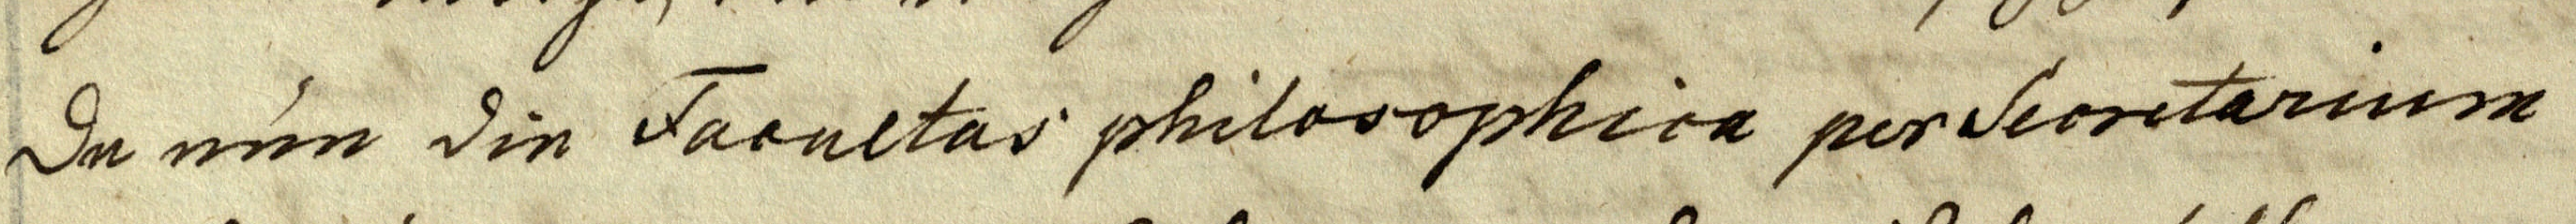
Da nun die Facultas philosophica per Secretarium
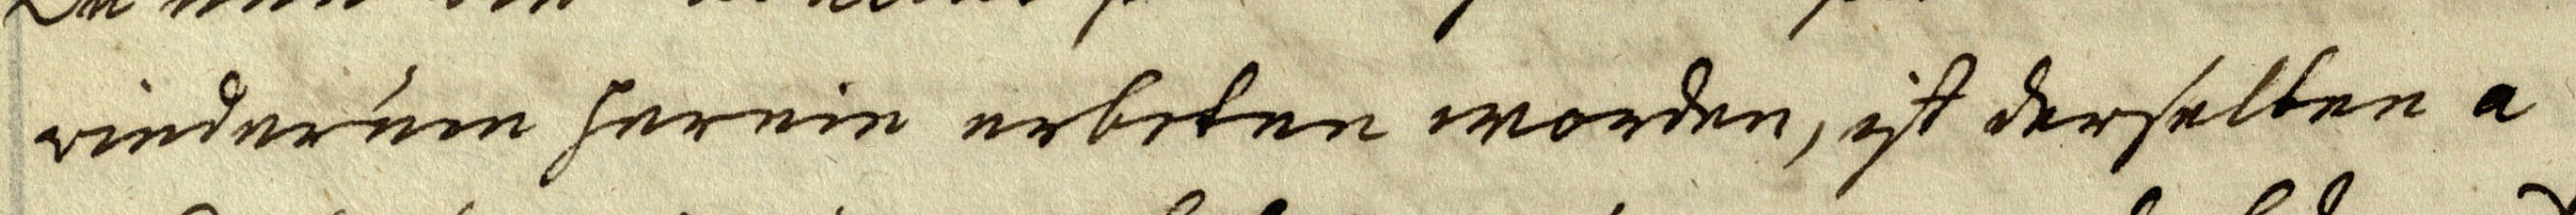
wiedrum herein erbeten worden, ist derselben a
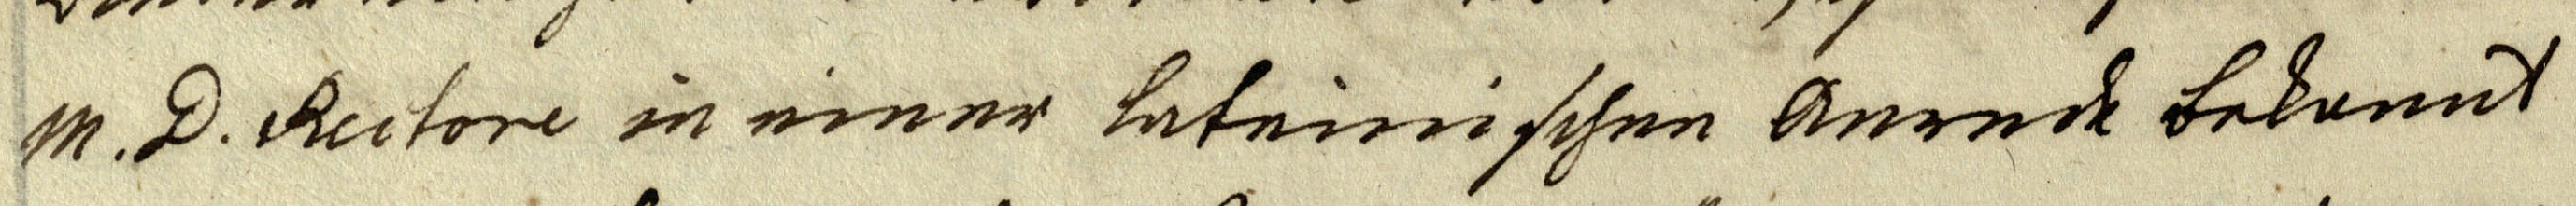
M. D. Rectore in einer lateinischen Anrede bekannt
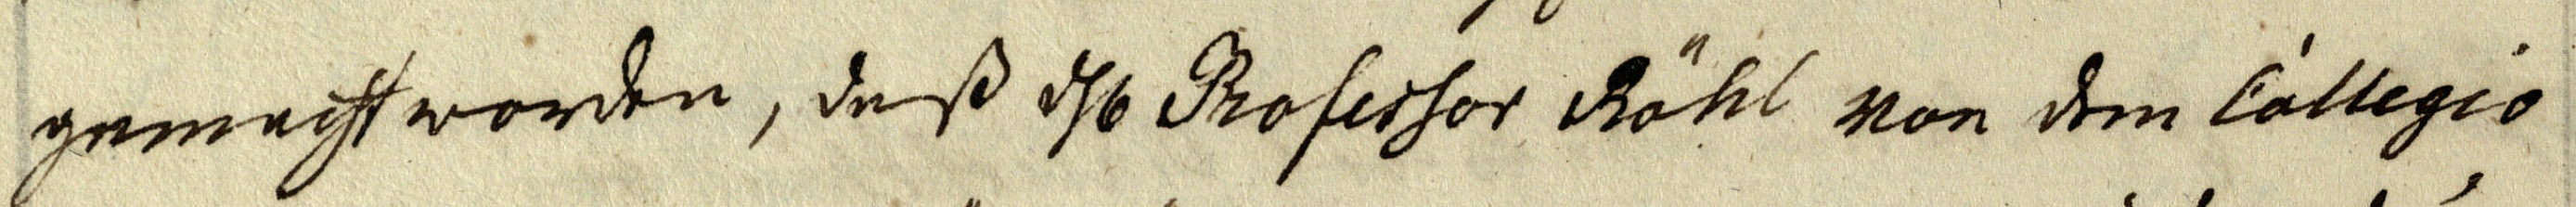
gemacht worden, daß dh Professor Röhl von dem Collegio
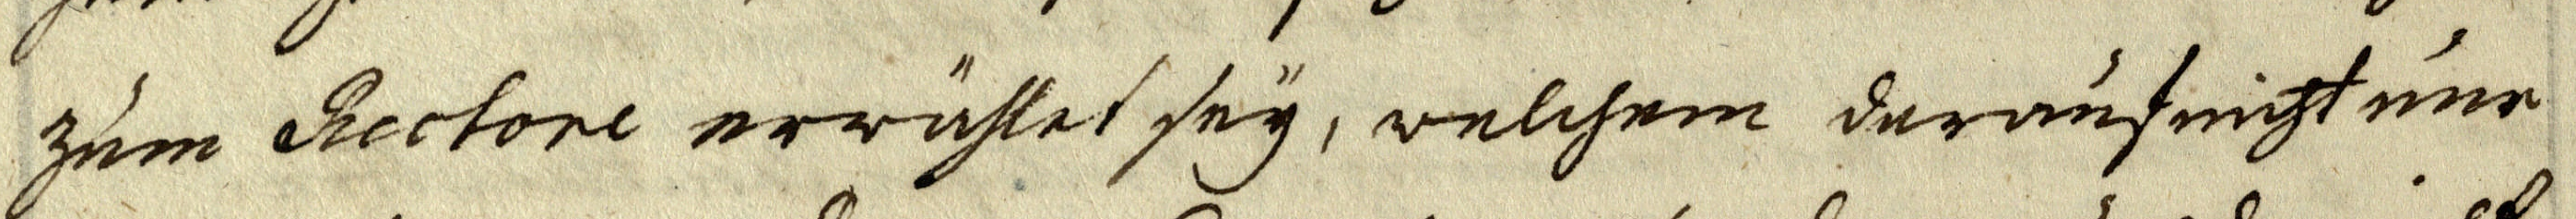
zum Rectore erwählet seÿ, welchem darauf nicht nur
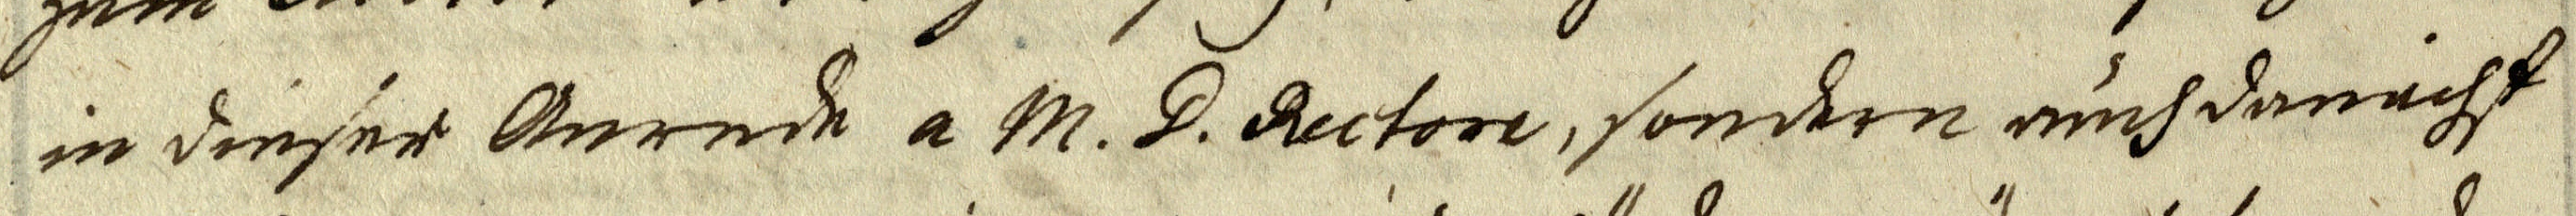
in dieser Anrede a. M. D. Rectore, sondern auch danächst
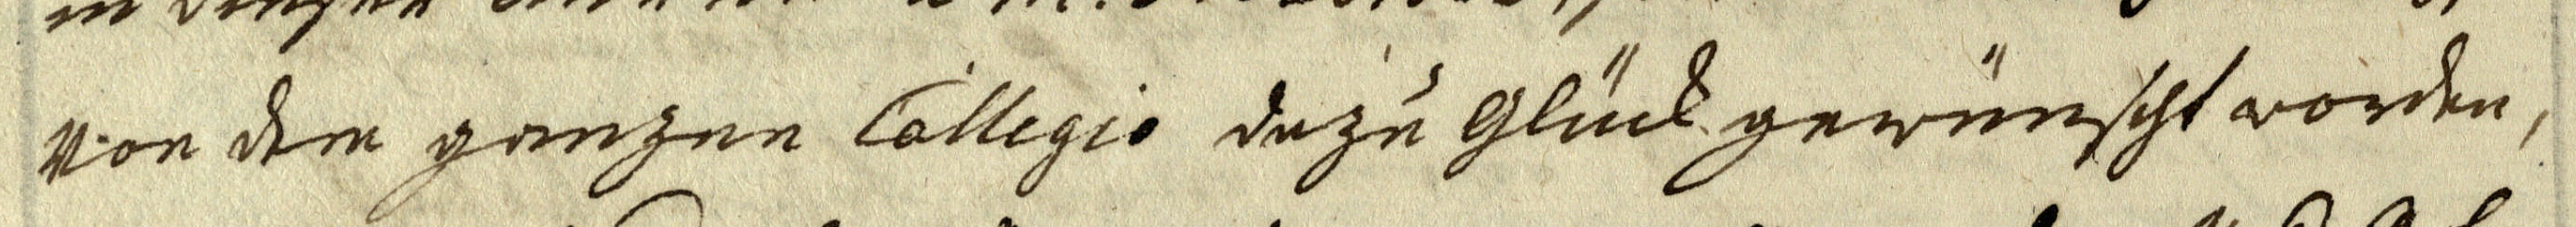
von dem ganzen Collegio dazu Glück gewünscht worden,
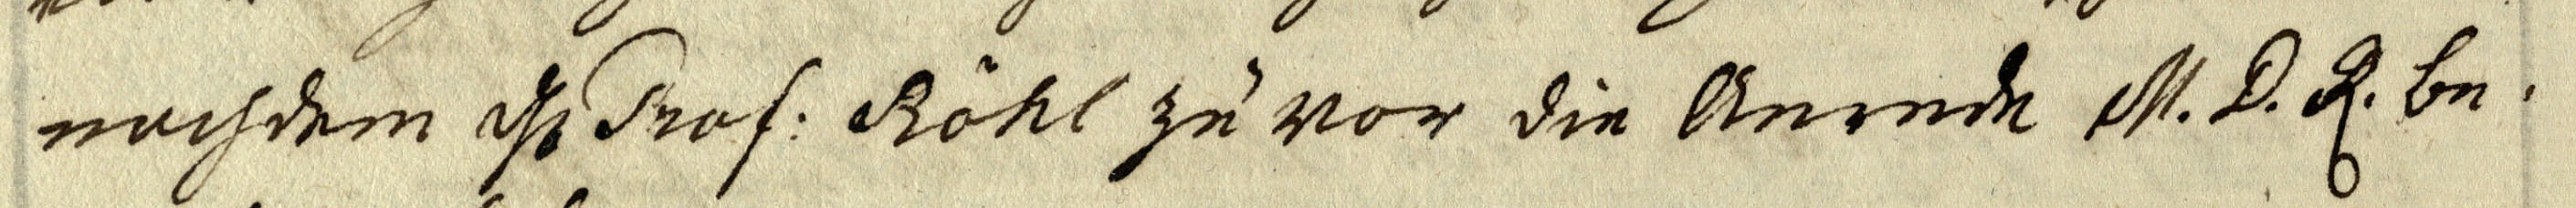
nachdem dh Prof. Röhl zuvor die Anrede M. D. R. be¬
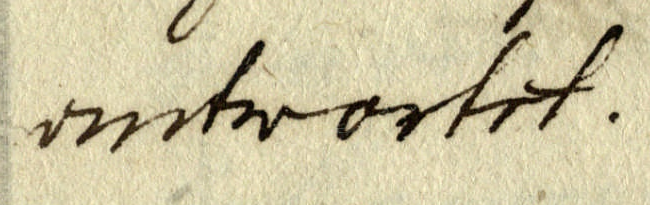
antwortet.
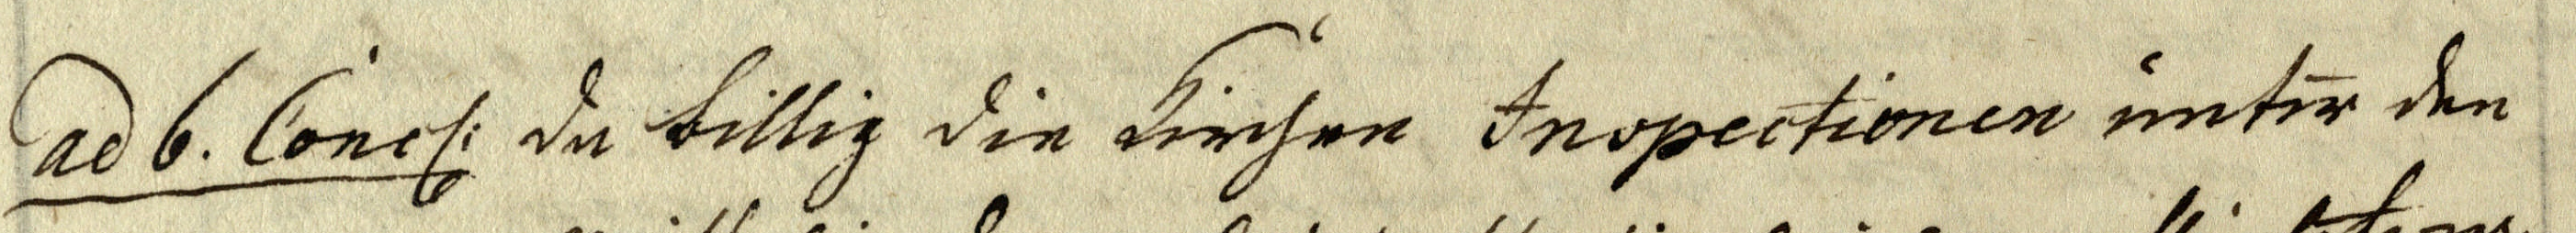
ad 6. Concl. Da billig die Kirchen Inspectionen unter den
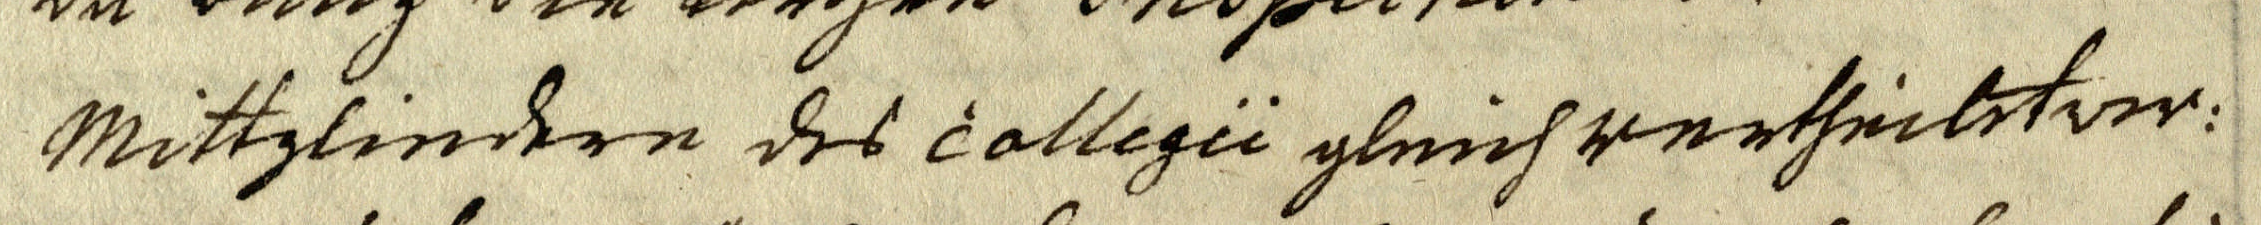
Mitgliedern des collegii gleich vertheilet wer¬
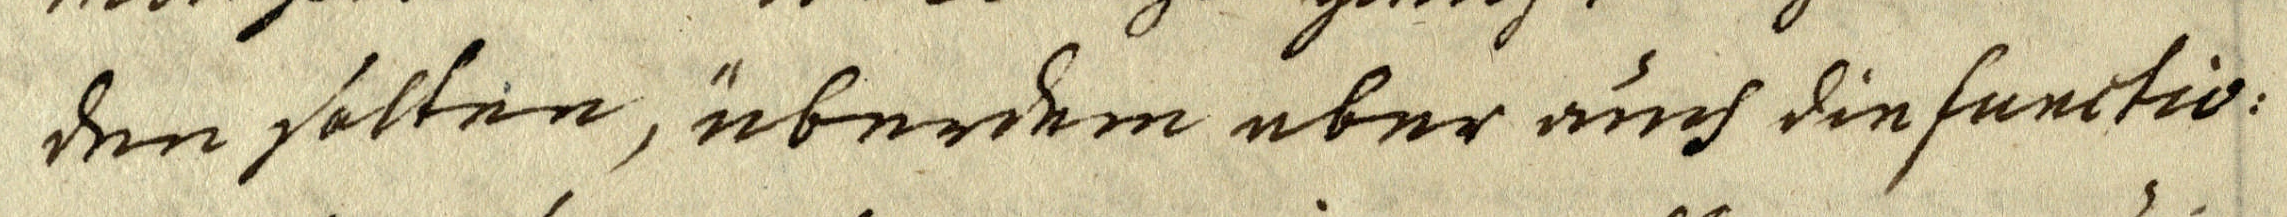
den solten, überdem aber auch die functio¬
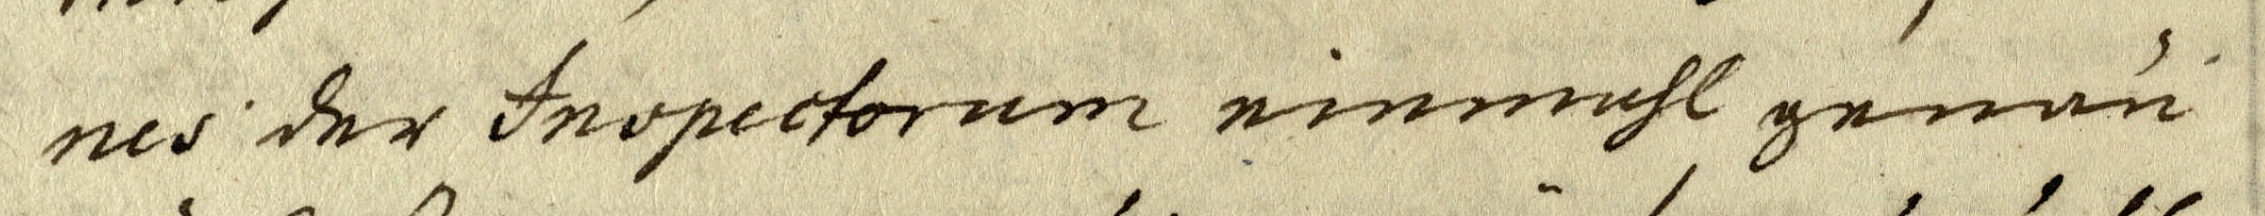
nes der Inspectorum einmahl genau
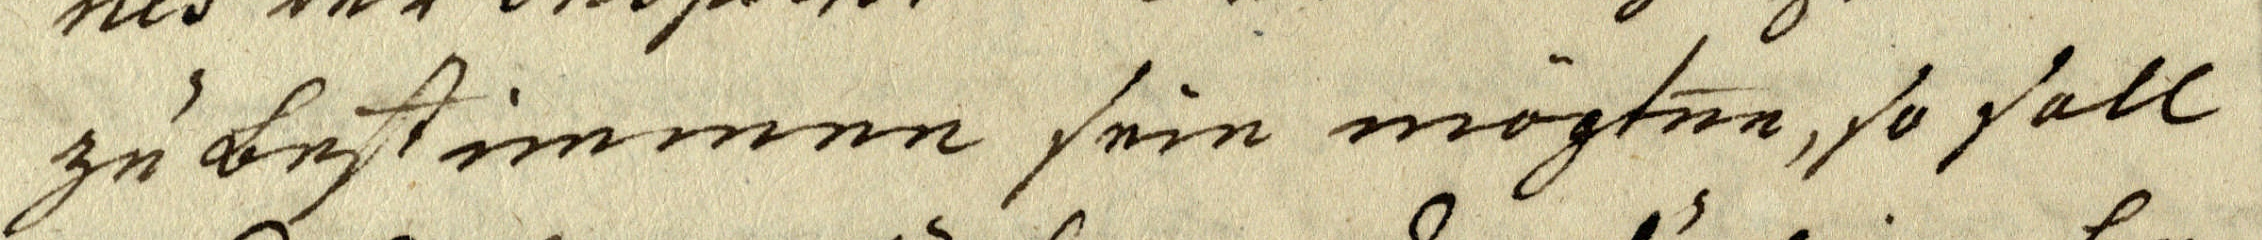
zu bestimmen sein mögten, so soll
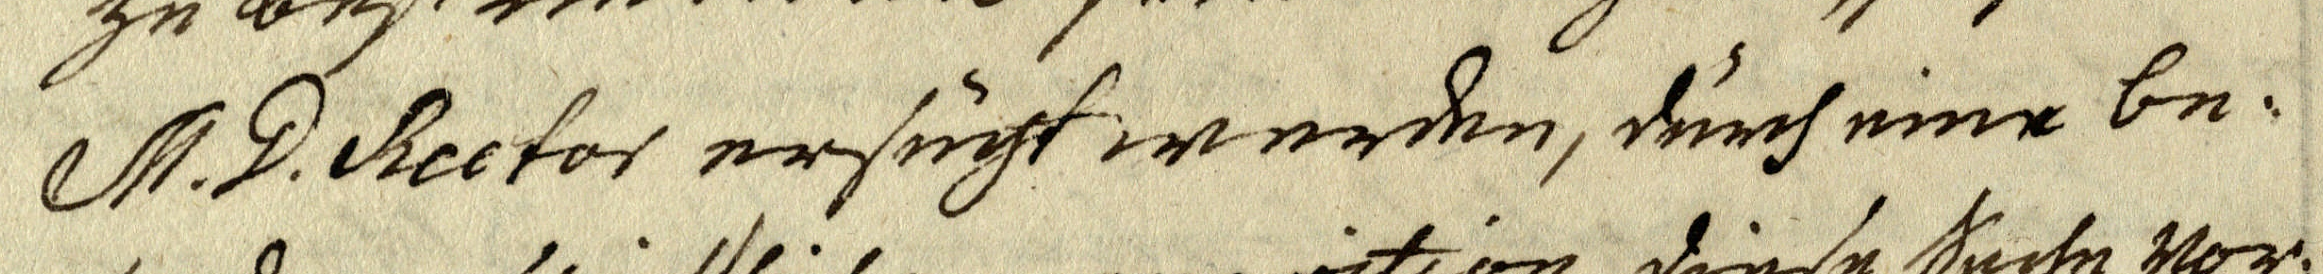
M. D. Rector ersucht werden, durch eine be¬
